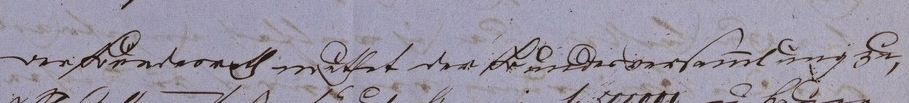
Der Bundesrath muthet der Bundesversammlung zu,
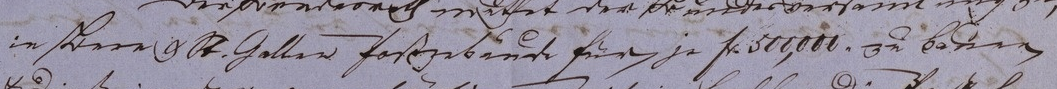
in Bern & St. Gallen Postgebäude für je Fr. 500,000. zu bauen
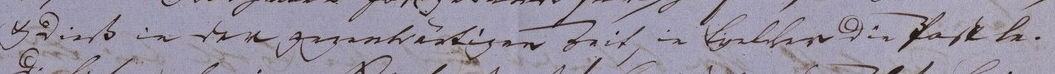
& dieß in der gegenwärtigen Zeit, in welcher die Post le-
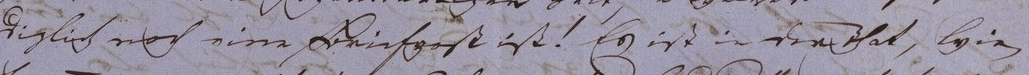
diglich noch eine Briefpost ist! Es ist in der That, wie
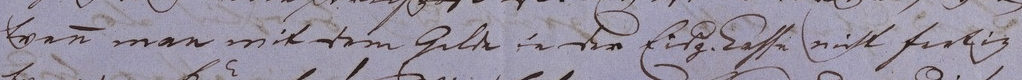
wenn man mit dem Gelde in der Eidg. Casse nicht fertig
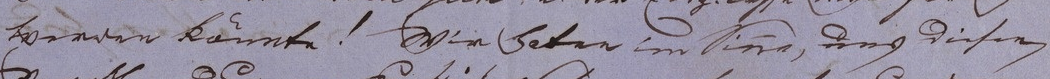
werden könnte! Wir haben im Sinne, uns diesen
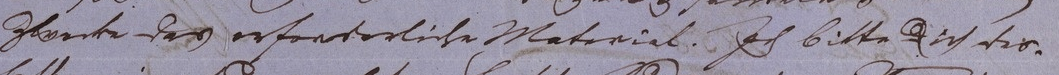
Zwecke das erforderliche Material. Ich bitte Dich des-
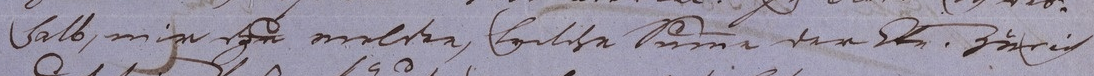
halb, mir zu melden, welche Summe der Ctn. Zürich
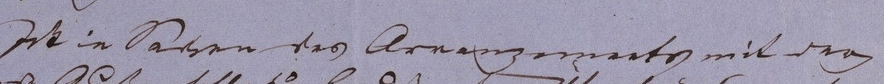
Ist in Sachen des Arrangements mit der
